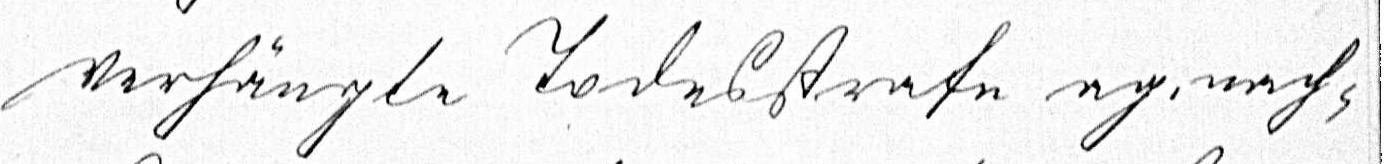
verhängten Todesstrafe ag. nach¬
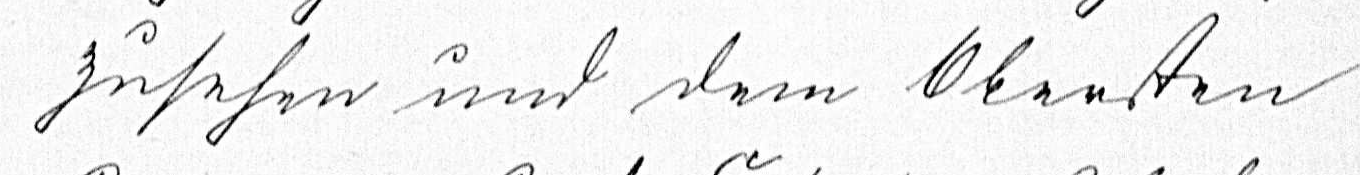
zusehen und dem Obersten
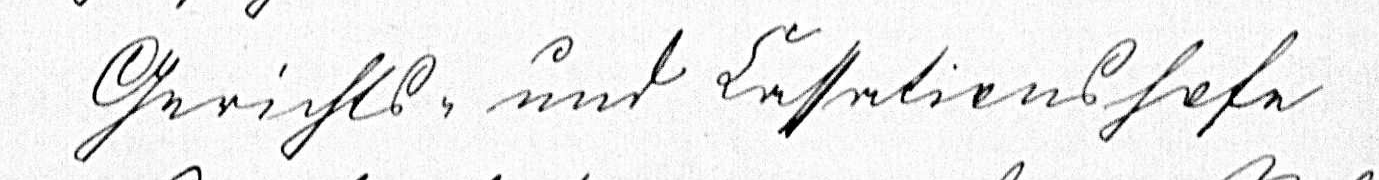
Gerichts- und Cassationshofe
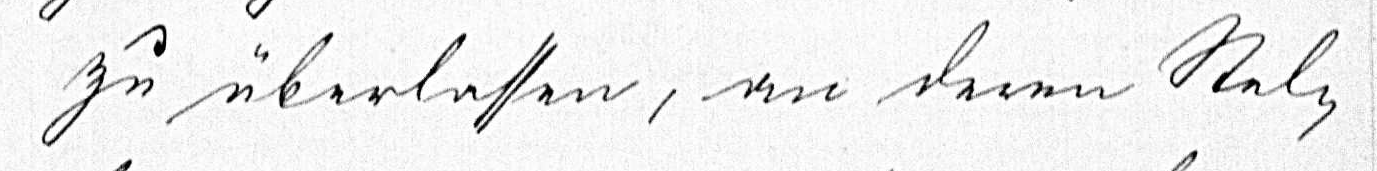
zu überlassen, an deren Stel¬
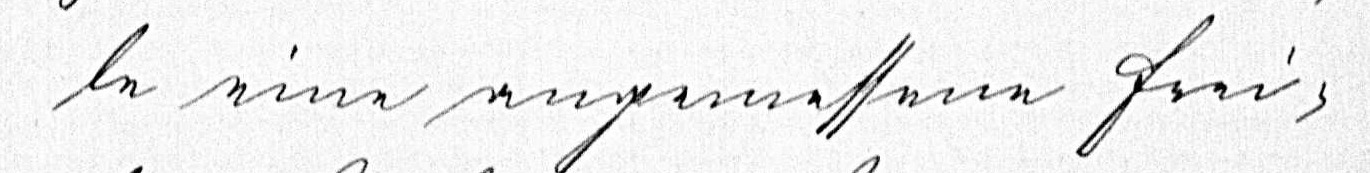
le eine angemessene Frei¬
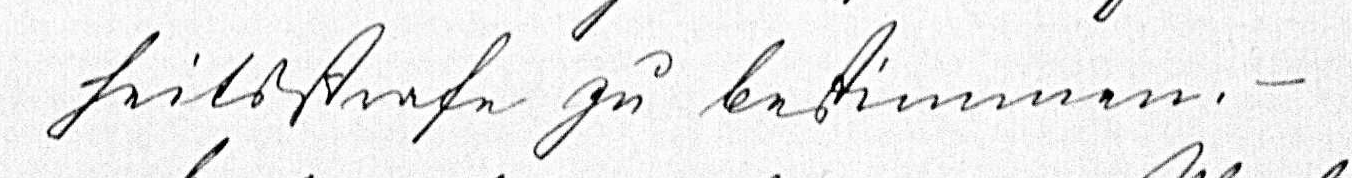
heitsstrafe zu bestimmen.–
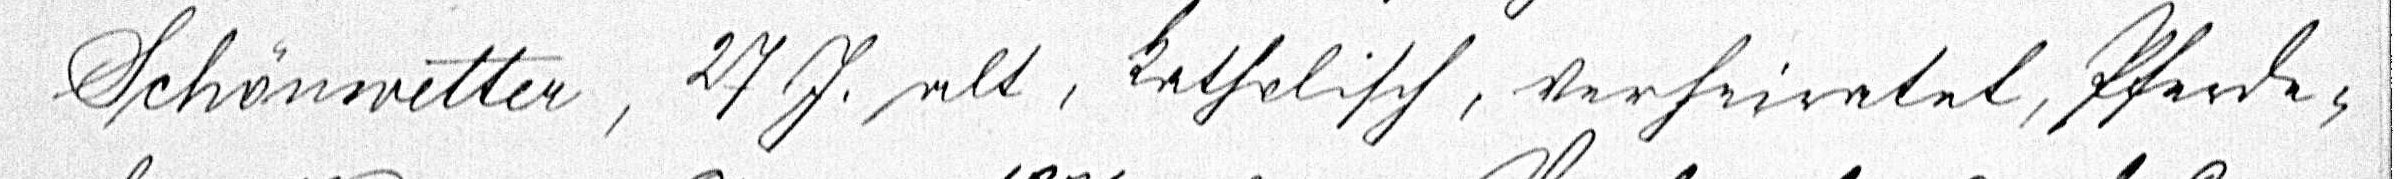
Schönwetter, 27 J. alt, katholisch, verheiratet, Pferde¬
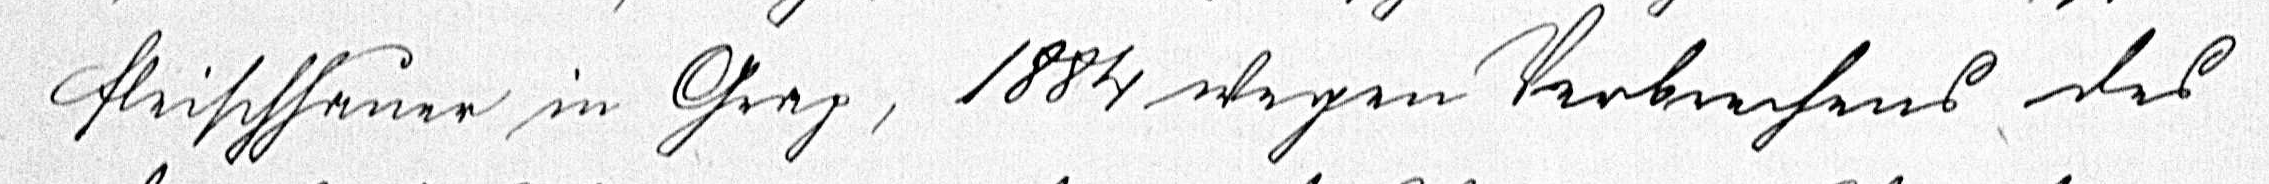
fleischhauer in Graz, 1884 wegen Verbrechens des
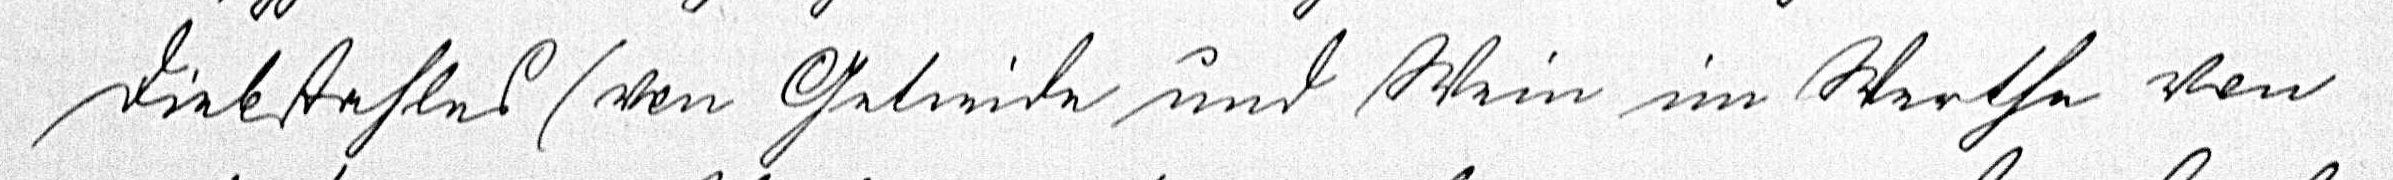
Diebstahles (von Getreide und Wein im Werthe vom
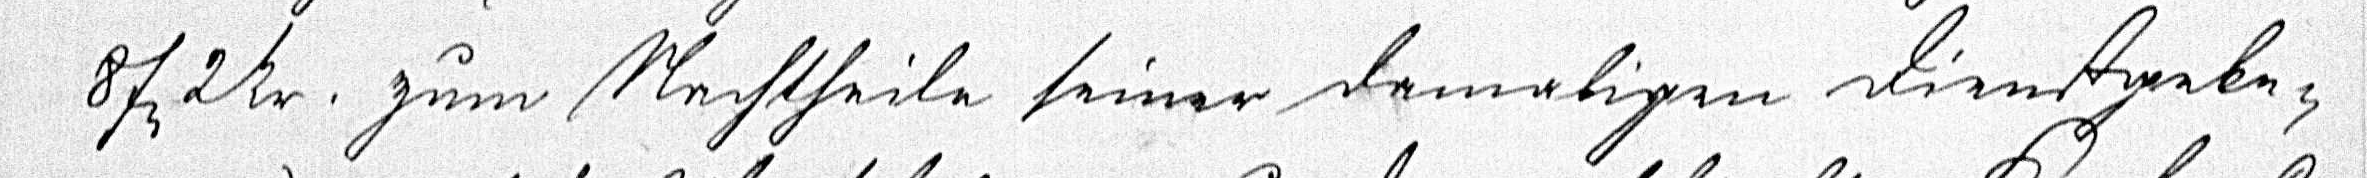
8f2kr zum Nachtheile seiner damaligen Dienstgebe¬
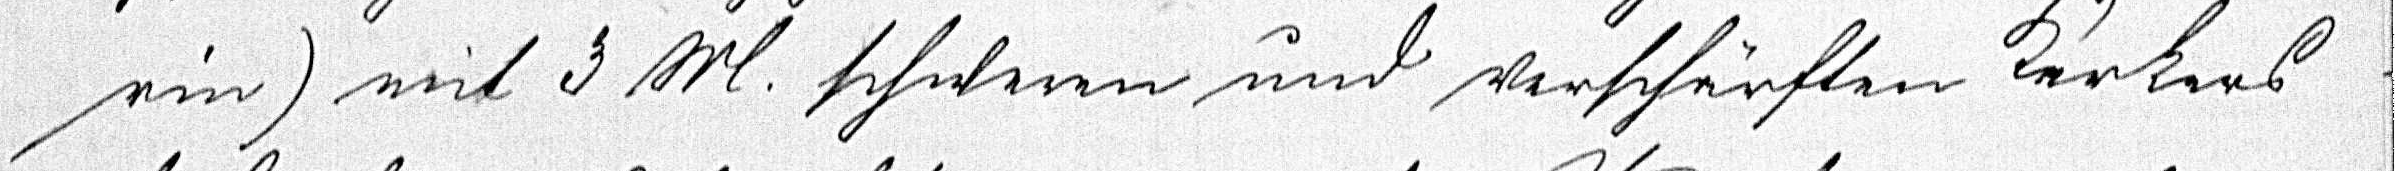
rin) mit 3 Wl schweren und verschärften Kerkers
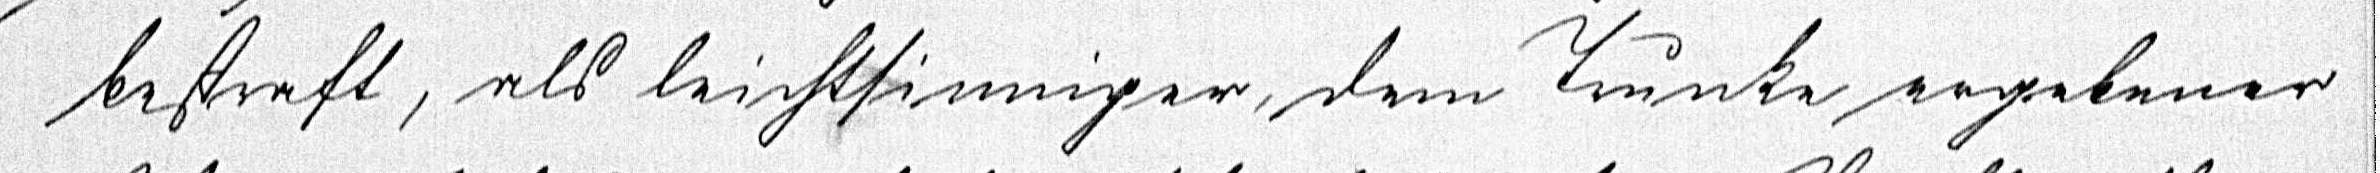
bestraft, als leichtsinniger, dem Trunke ergebener
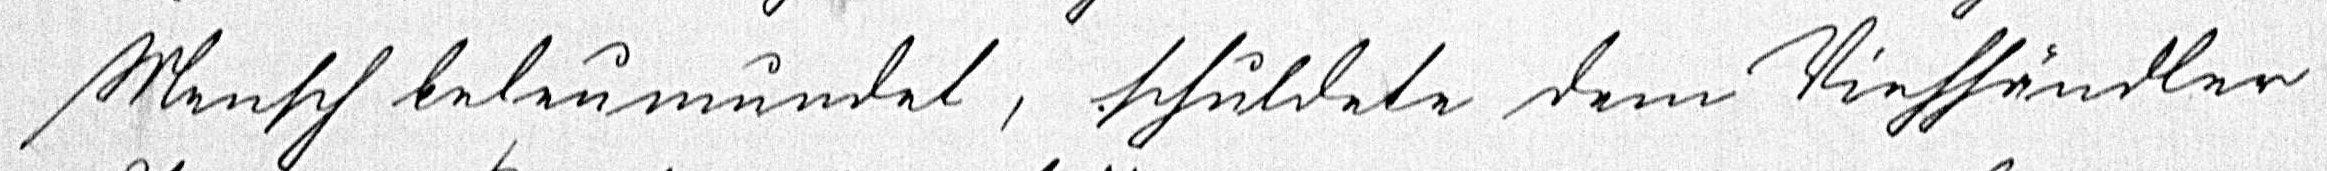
Mensch beleumundet, schuldete dem Viehhändler
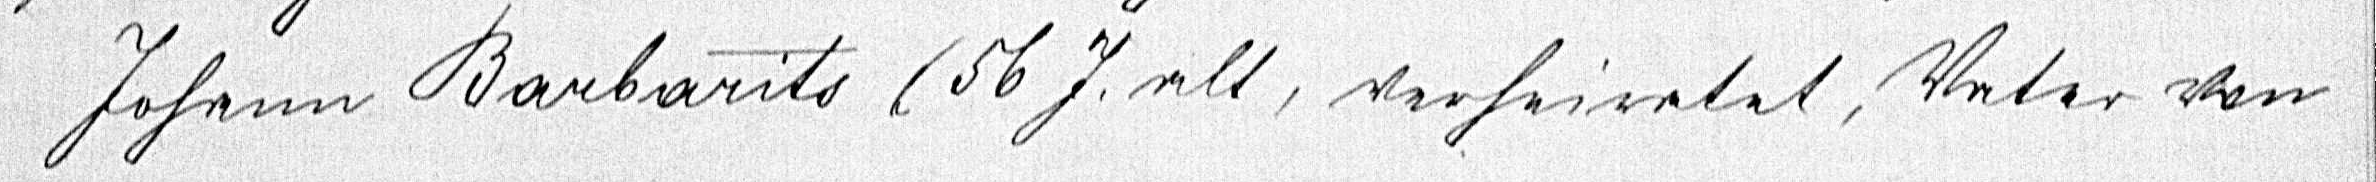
Johann Barbarits (56 J. alt, verheiratet, Vater von
